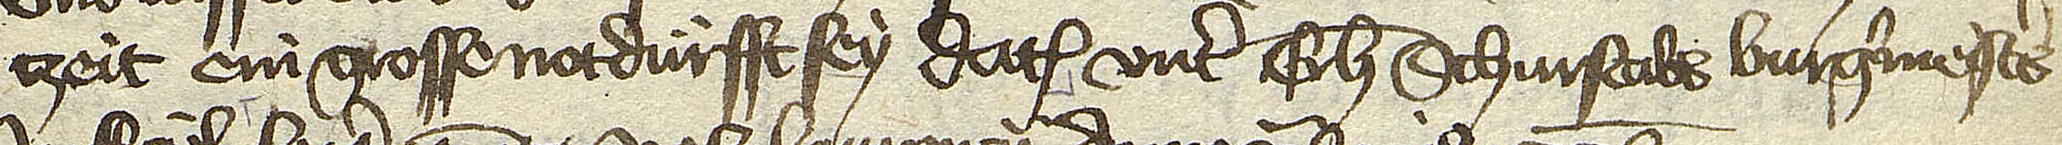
cʒeit ein groſſe notdürfft ſey dat* vnt* Erh* Schurſtabs burg*meiſts*
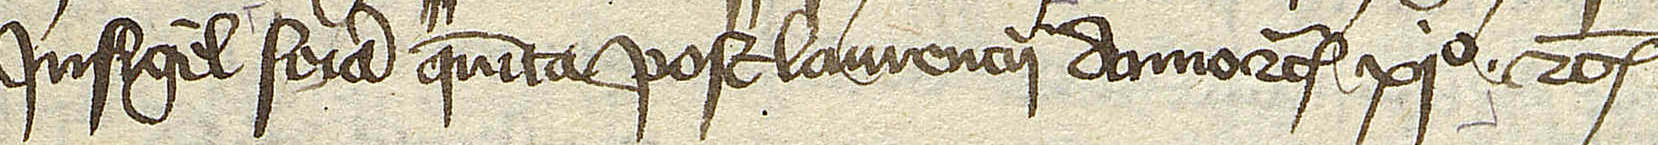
Inſigel feia* quita* poſt laurencii Anno ec* xi* . ec*
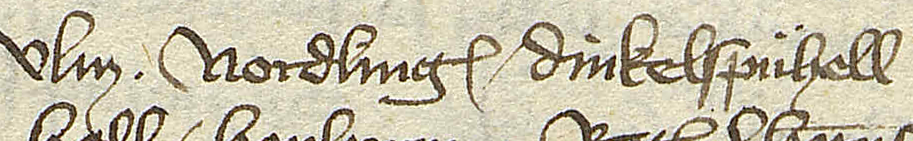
Vlm. Nordling* / dinkelſpühell
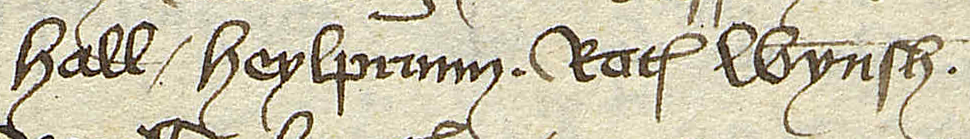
hall / heylprunn . Rot* wynſh .
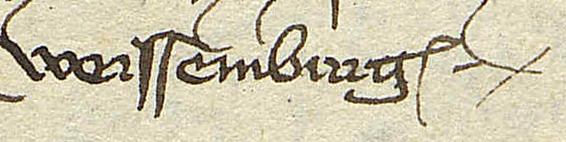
weiſſemburg* . /
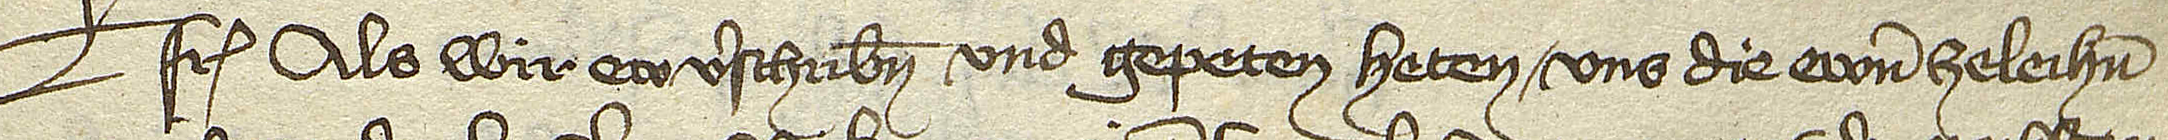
L* fr* Als wir ew v*ſchribn* vnd gepeten heten / vns die ewn* cʒeleihn*
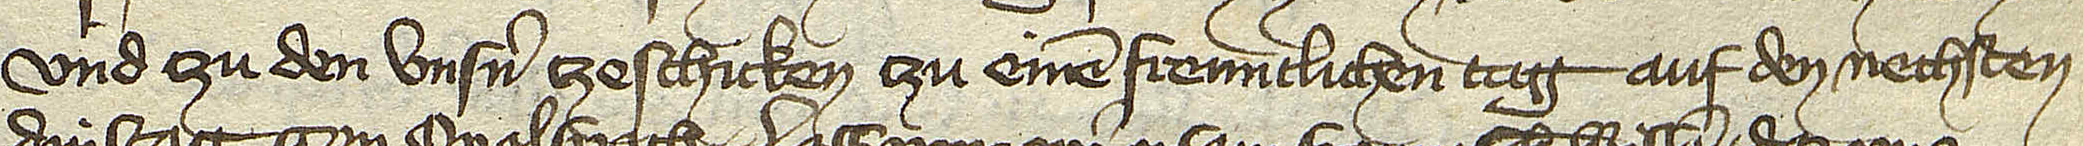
vnd cʒu den vnſn* cʒeſchicken cʒu eine* freuntlichen tag auf den nechſten
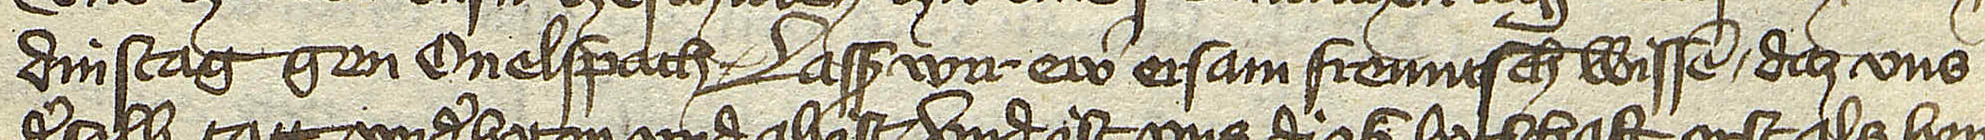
dinſtag gen Onelſpach / Laſſ* wir ew erſam freuntſch* wiſſe* / daʒ vns
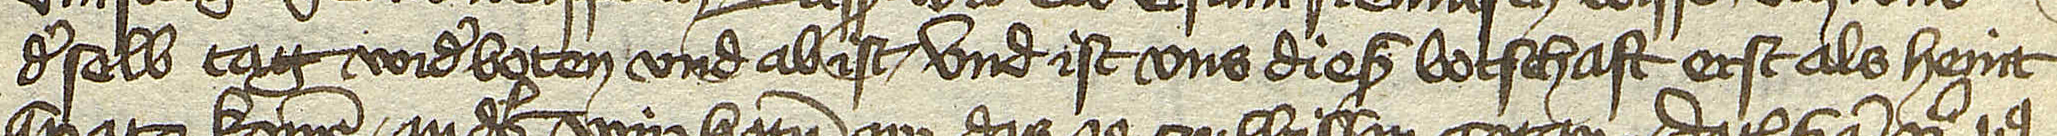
d*ſelb tag wid*boten vnd ab iſt / vnd iſt vns dieſ* botſchaft erſt als heint
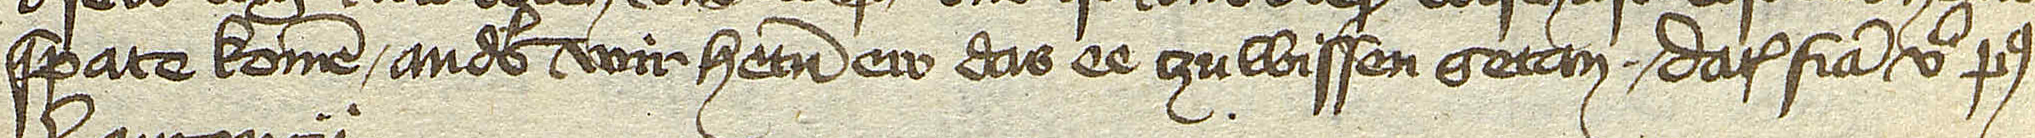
ſpate kome* / ands wir hetn* ew das ee cʒuwiſſen getan / dat* fia* v* p*
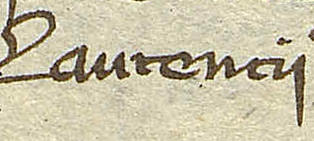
Laurencii
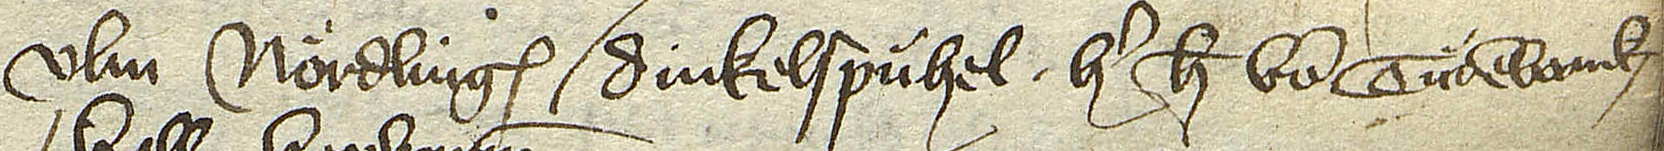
vlm Nördlling* / dinkelſpühel . h* h* vo* Türe*vank
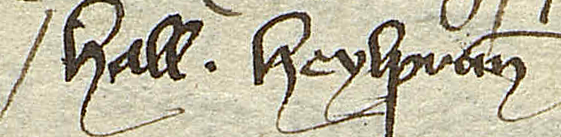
/ hall . heylprun*
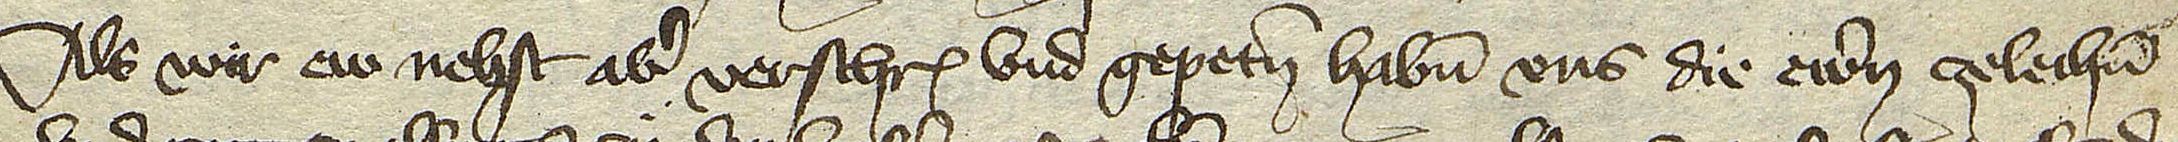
Als wir ew nehſt ab* verſchr* vnd gepetn* habn* vns die ew*n cʒeleihn*
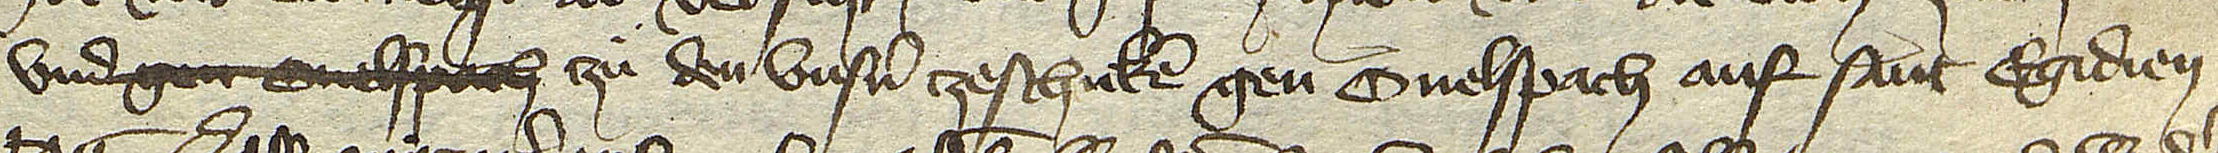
vnd gen Onelſpach cʒü den vnſn* cʒeſchicke* gen Onelſpach auf ſant Egidien
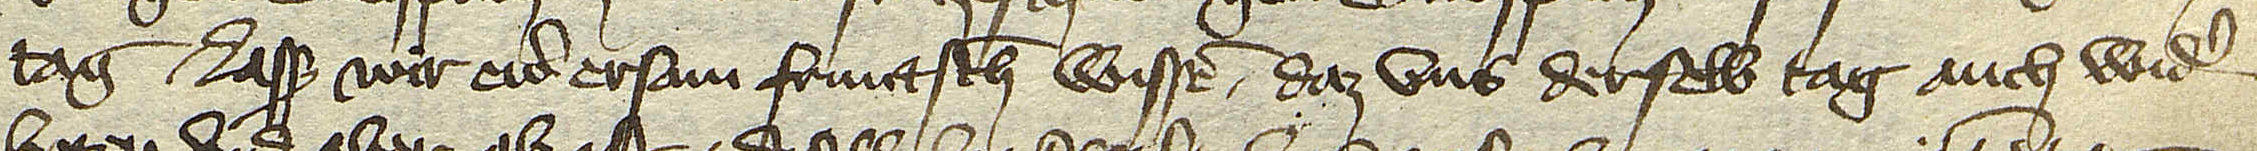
tag / Laſſ* wir ew* erſam fruntſch* wiſſe* / daʒ vns derſelb tag auch wid*
